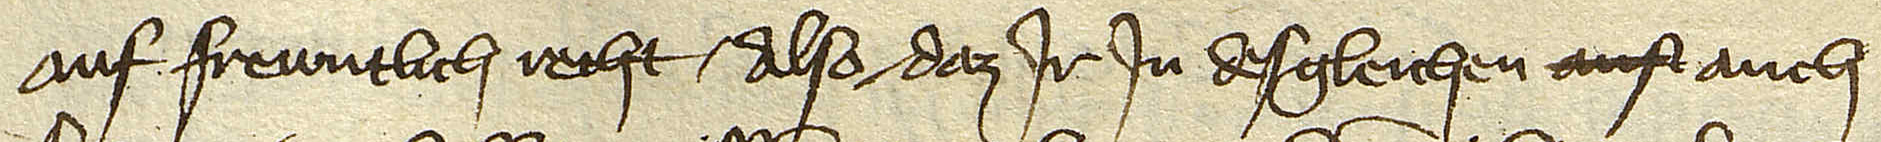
auf frewntlich recht / Alſo / daʒ Ir In deſgleichen auſ auch
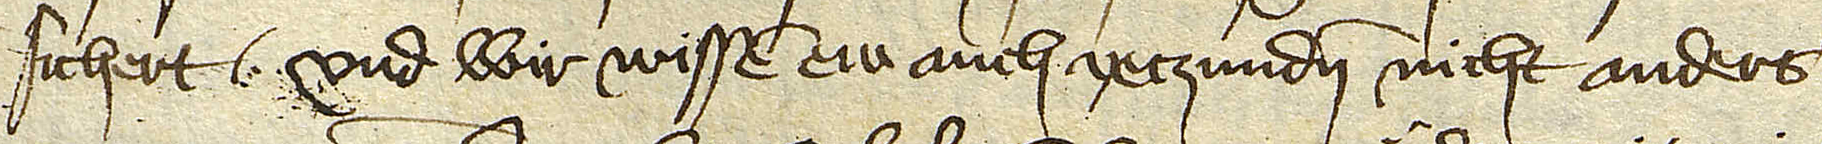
ſichert / . vnd wir wiſſe* ew auch yecʒundn* nicht anders
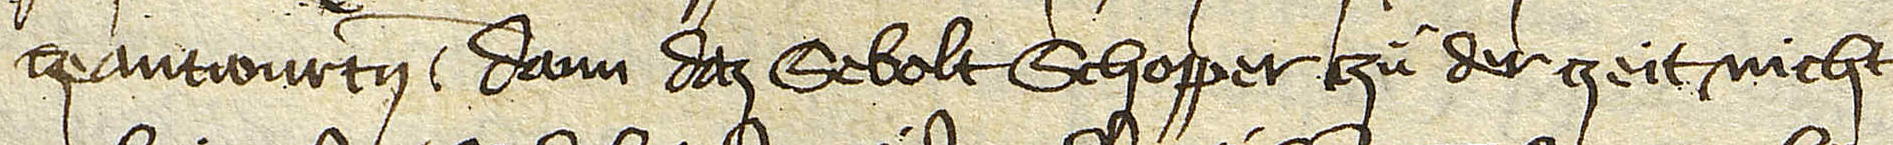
cʒeantwurtn* / dann daʒ Sebolt Schopper cʒü der cʒeit nicht
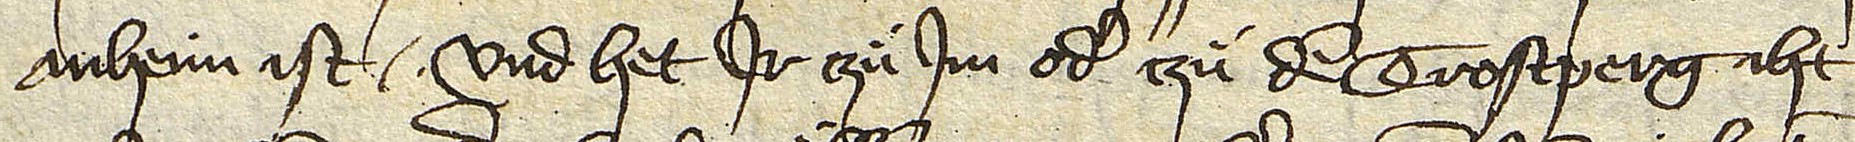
anheim iſt / . vnd het Ir cʒü Im od* ʒü d* Troſtperg iht
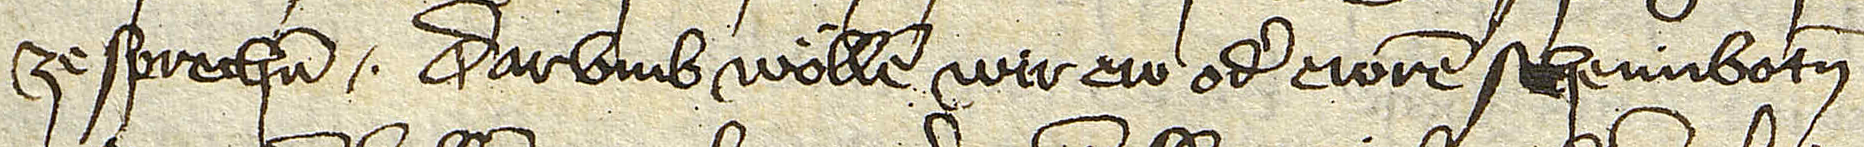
cʒe ſprechn* / . Darvmb wölle* wir ew* od* ewre* ſcheinbotn*
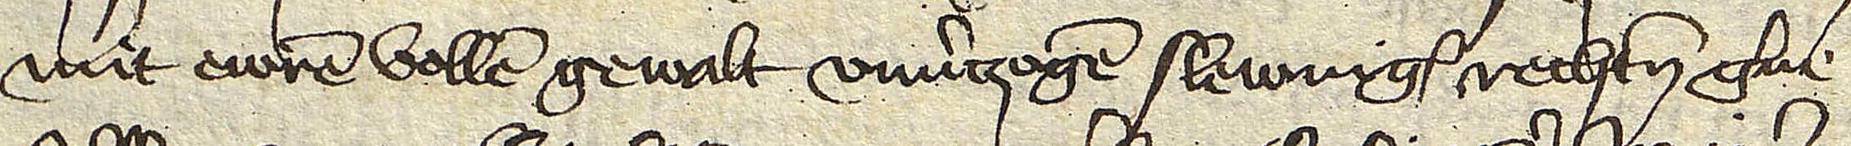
mit ewre* volle* gewalt vnu*cʒoge* ſlewnig* rechtn* g*ne
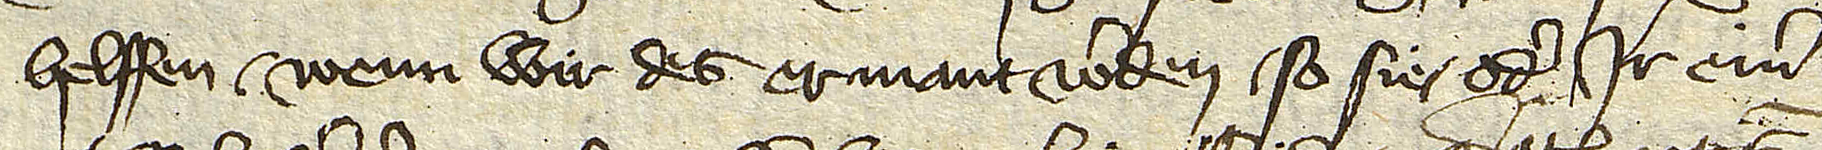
helffen / wenn wir des ermant w*den / ſo ſie / od* Ir ein*
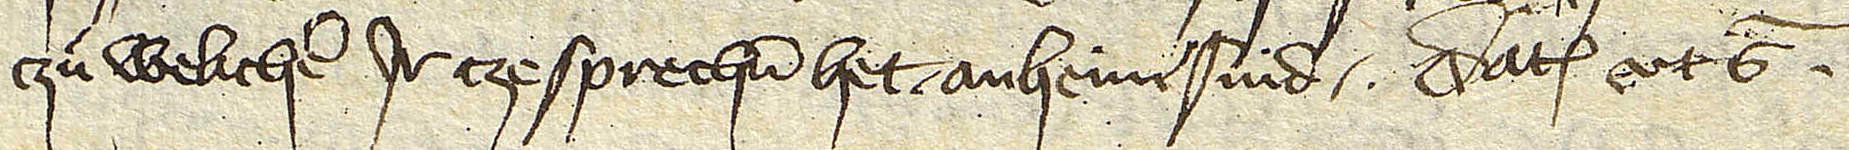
cʒu weliche* Ir cʒeſprechn* het / anheim ſind / . Dat* vt s* .
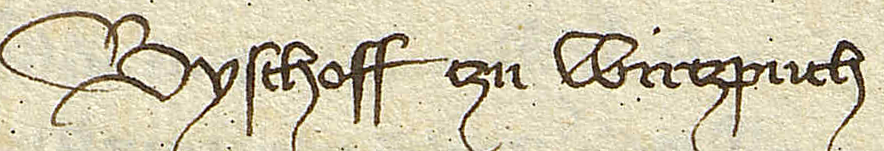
Byſchoff cʒu Wircʒpuch
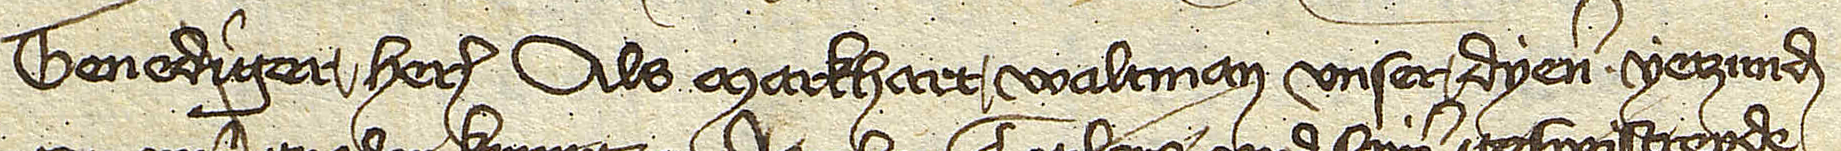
Gnediger her* Als Markhart waltman vnſer dyen* . yecʒund*
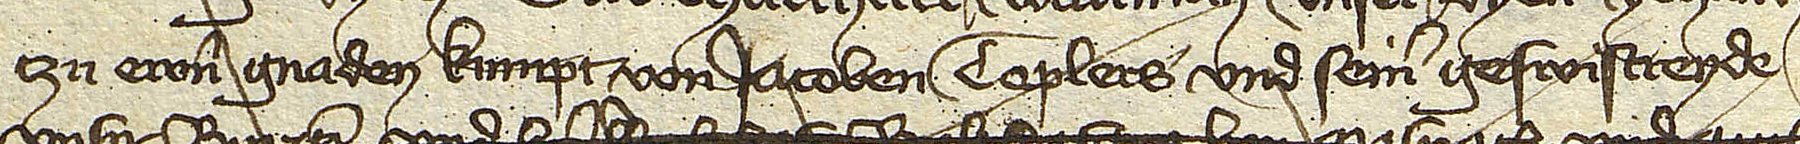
cʒu ewn* gnaden kumpt von Iacoben Toplers vnd ſein* geſwiſtreyde
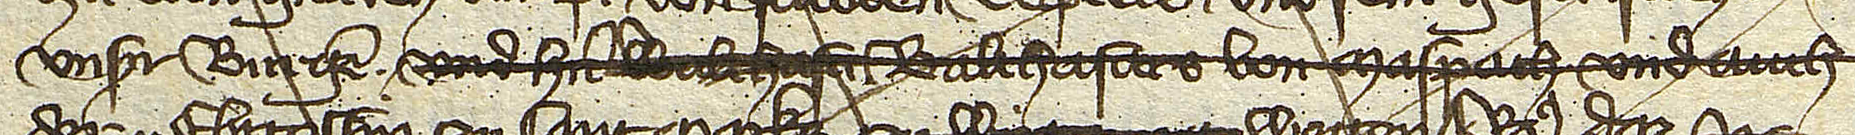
vnſ*r Burge* . vnd hn* Walthaſa Balthaſars von Maſpach vnd auch
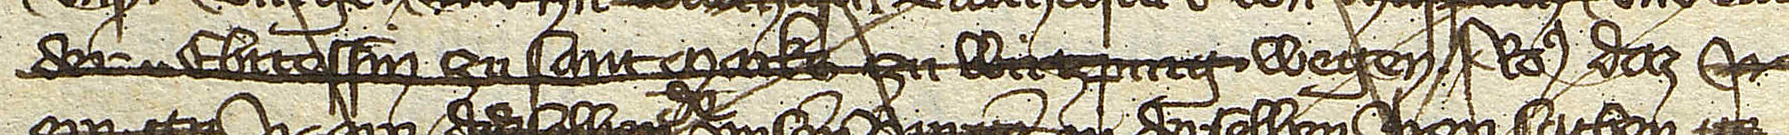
der ~ Ebtteſſin cʒu ſant Marks cʒu wircʒpurg wegen Ro* daʒ Ir
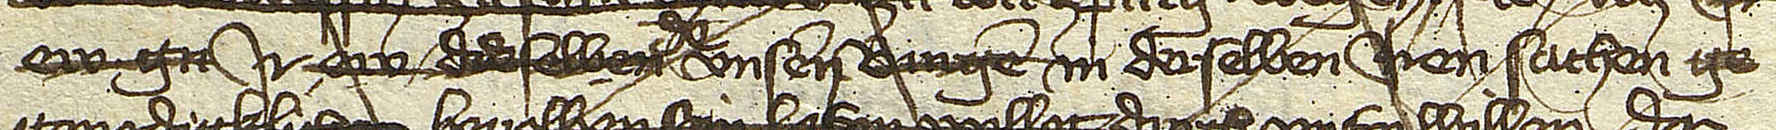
ew gn Ir ew dieſelben vnſe*n Burge* in dieſelben Iren ſachen ge
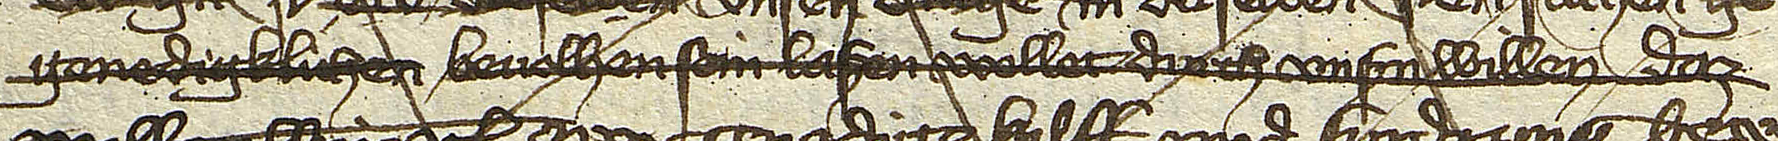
genedigklichen beuolhen ſein laſʒen wollet durch vnſ*n willen / daʒ
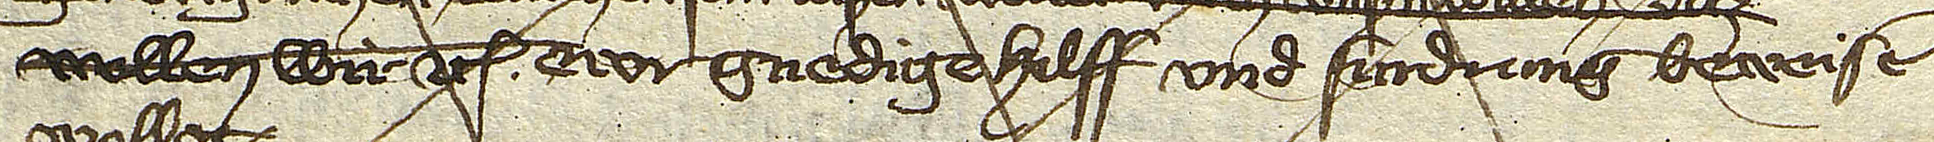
wollen wir ec* . ewr gnedige hilff vnd furdrung beweiſe*
